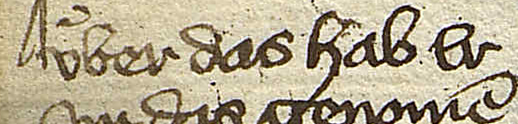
v̈ber das hab Er
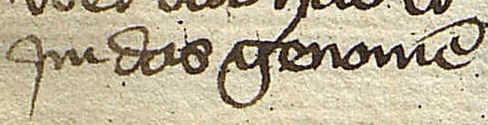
Im das genome*
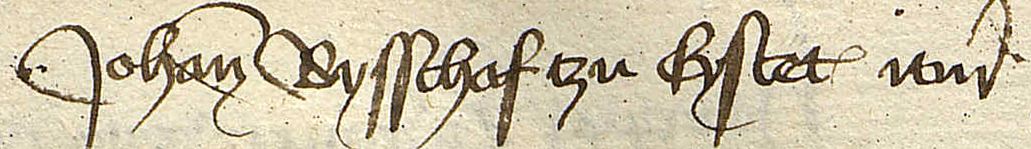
Iohan* Byſſchof cʒu Eyſtet* it*m
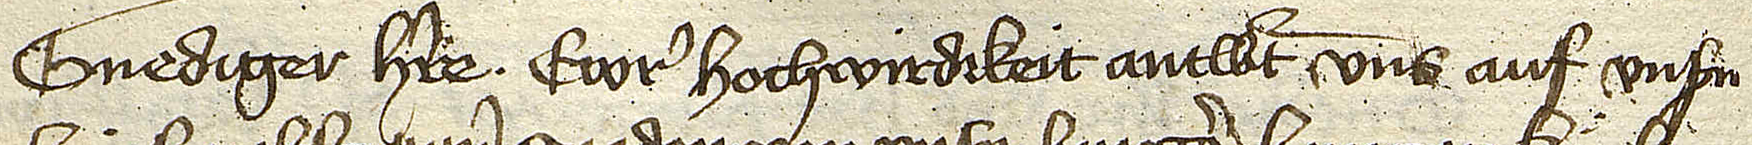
Gnediger h*re . Ew*r hochwirdikeit antw*t vns auf vnſ*n
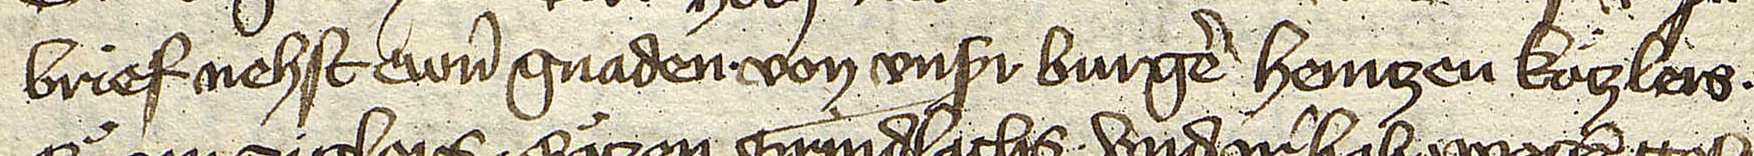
brief nehſt ew*n gnaden . von vnſ*r burge* heincʒen köcʒlers .
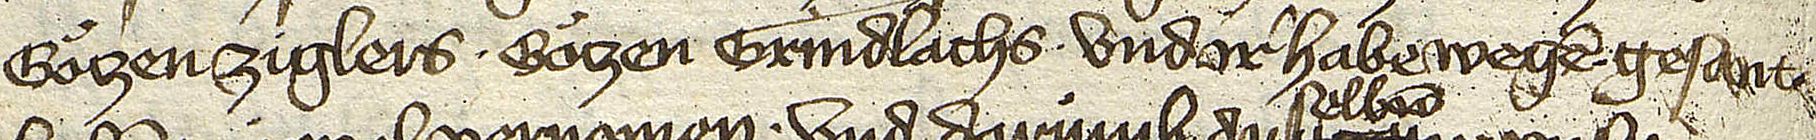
Göcʒen cʒiglers . Göcʒen Grindlachs . vnd ir* habe wege* . geſant
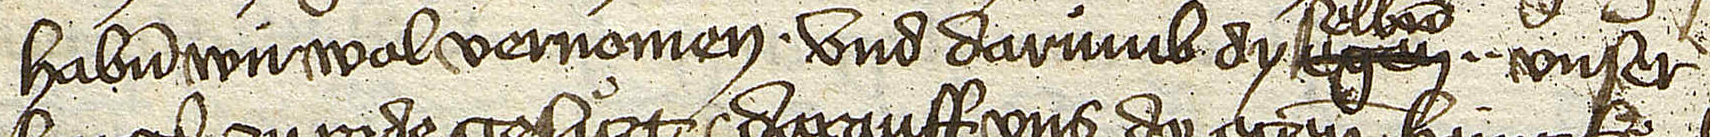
hab*n wir wol vernomen . Vnd darümb dy egen* ~ vnſer
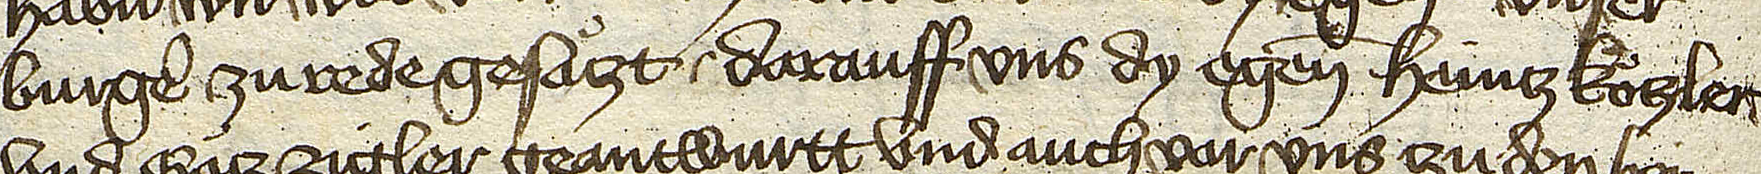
burge* cʒu rede geſäcʒt / darauff vns dy egen* heincʒ köcʒler
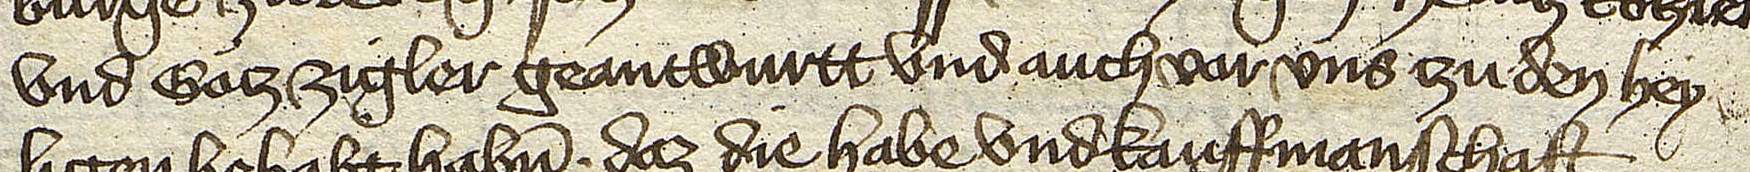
vnd Göcʒ cʒigler geantwurtt vnd auch vor vns cʒu den hey
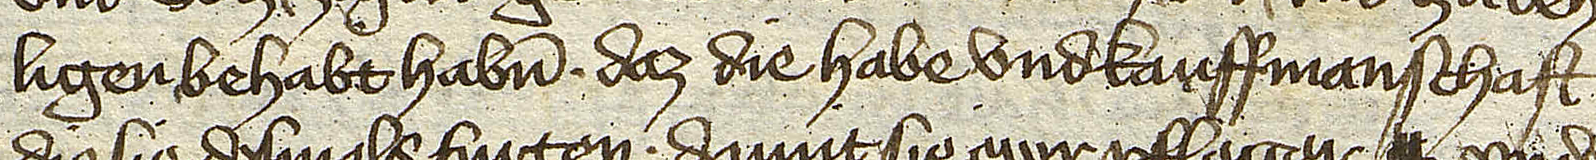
ligen behabt hab*n . daʒ die habe vnd kauffmanſchaft
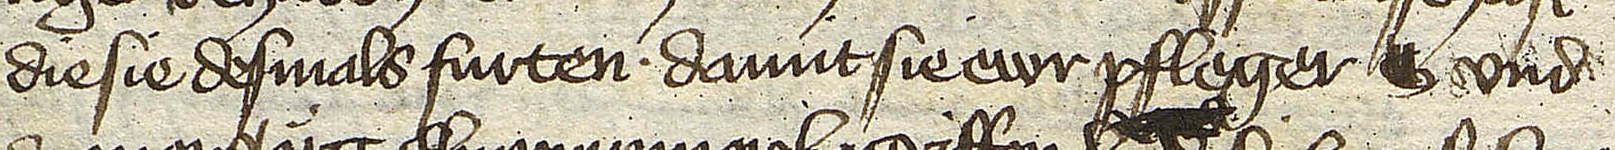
die ſie deſmals furten . damit ſie ewr pfleger % vnd
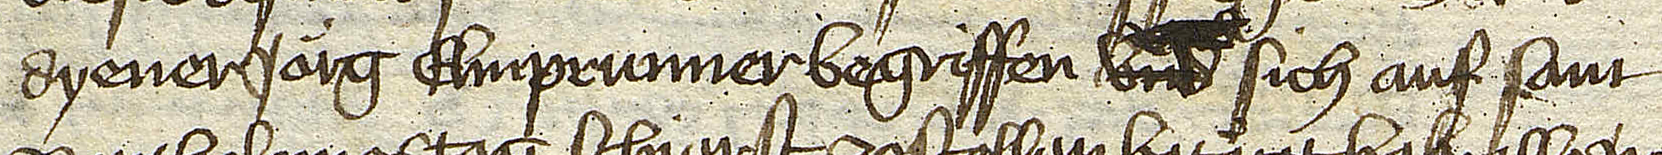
dyener Iörg Elmprunner begriffen vnd ſich auf ſant
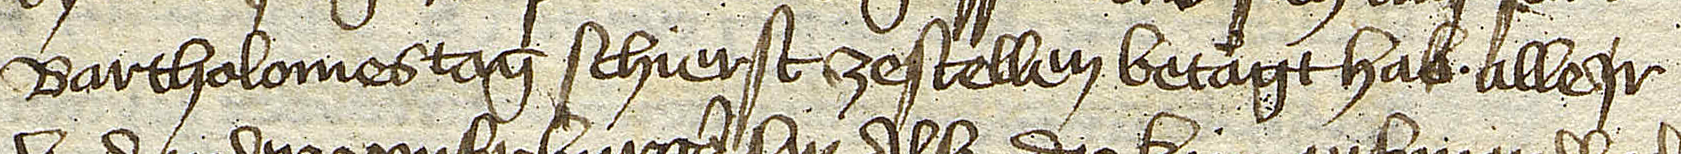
Bartholomes tag ſchieriſt cʒeſtellen betägt hab . alle Ir
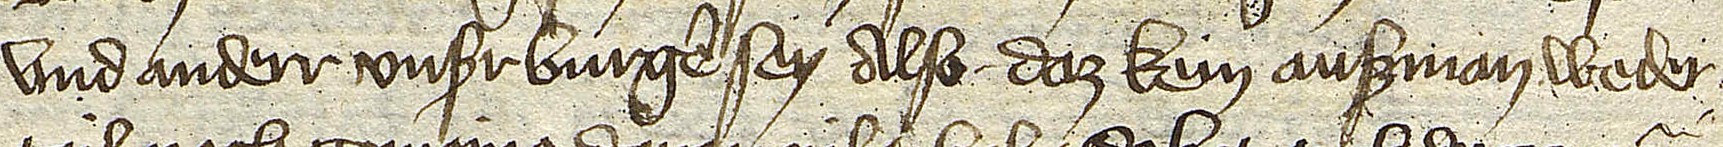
vnd anderr vnſ*r burge* ſey Alſo . daʒ kein auſʒman weder
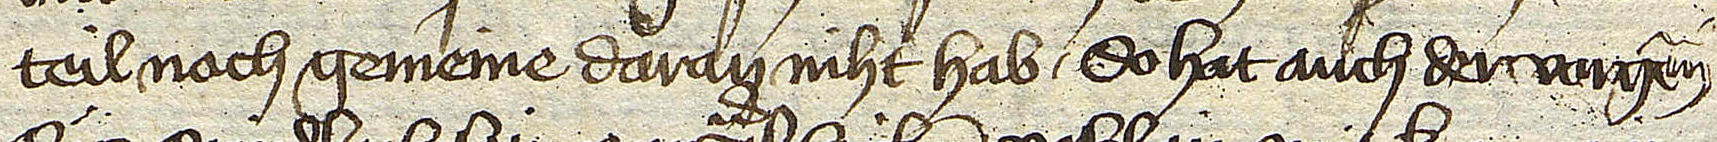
teil noch gemeine daran niht hab / So hat auch der vorgen*
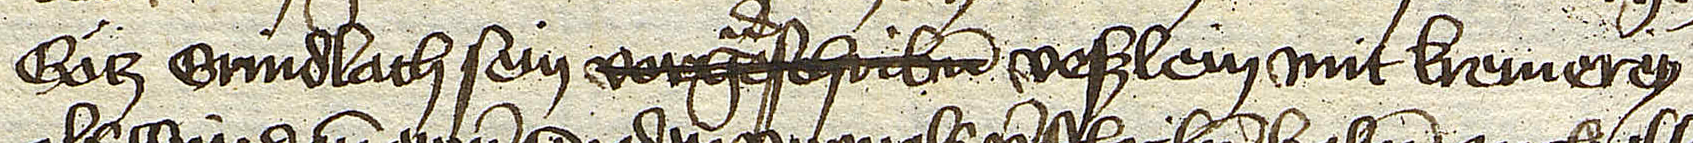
Göcʒ Grindlach ſein vorgeſchrib*n veſʒlein mit kremerey
